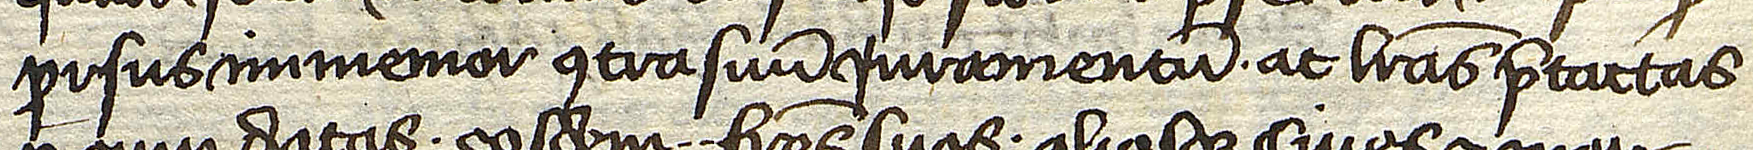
p*rſus immemor *tra ſuu* Iuramentu* . ac l*ras p*tactas
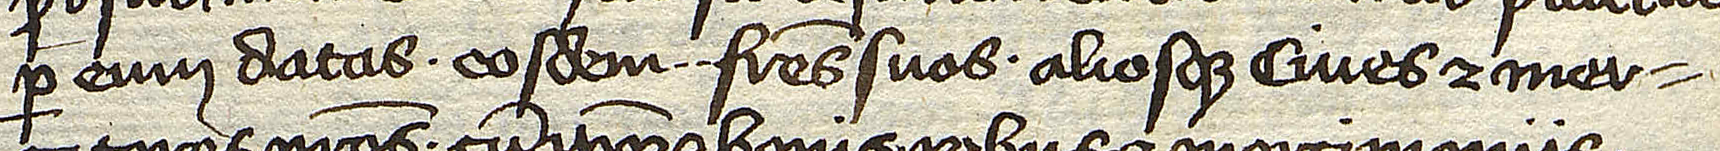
p* eum datas eoſdem . . f*res ſuos . alioſq* Ciues @ mer=
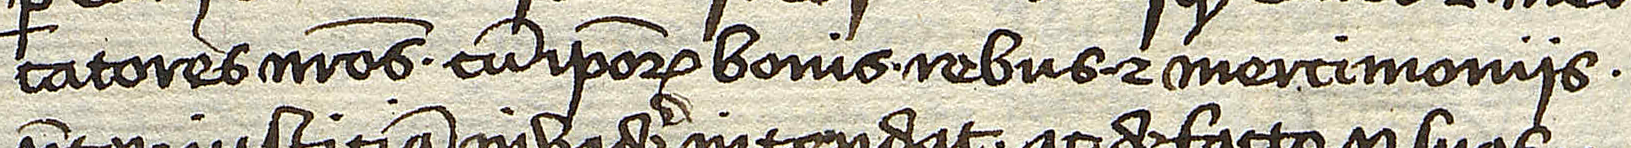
catores n*ros . cu* ip*or* bonis . rebus @ mercimoniis
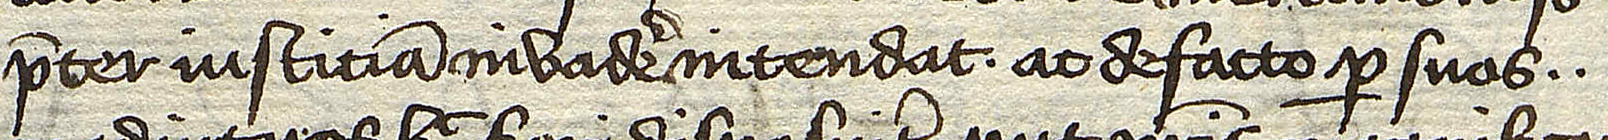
p*ter iuſtutia* invade* intendat . ac de facto p* ſuos . .
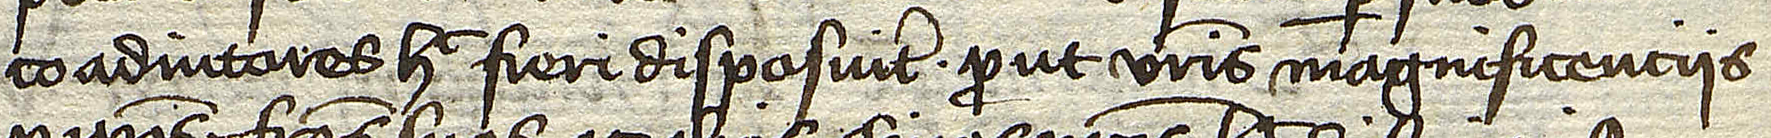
coadiutores h* fieri diſpoſu*it . p*ut v*ris magnificenciis
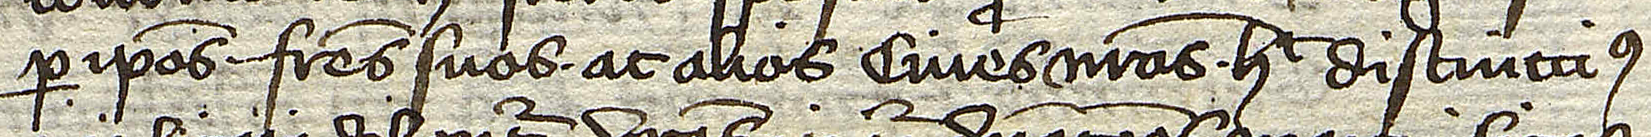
p* ip*os f*res ſuos . ac alios Ciues n*ros h* diſtincti*
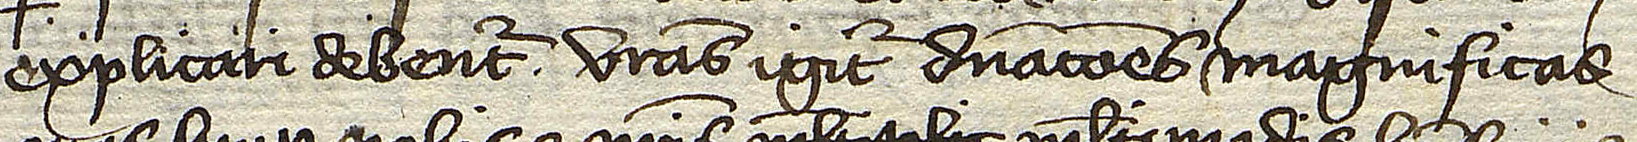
explicari debent* . V*ras igit* d*nac*o*es magnificas
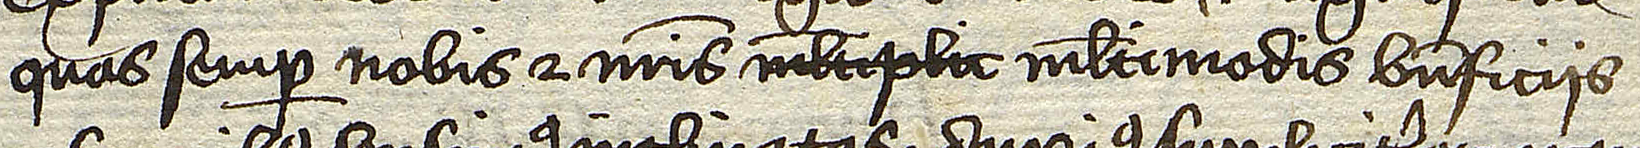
quas ſemp* nobis @ n*ris mltipli* m*ltimodis b*n*ficiis
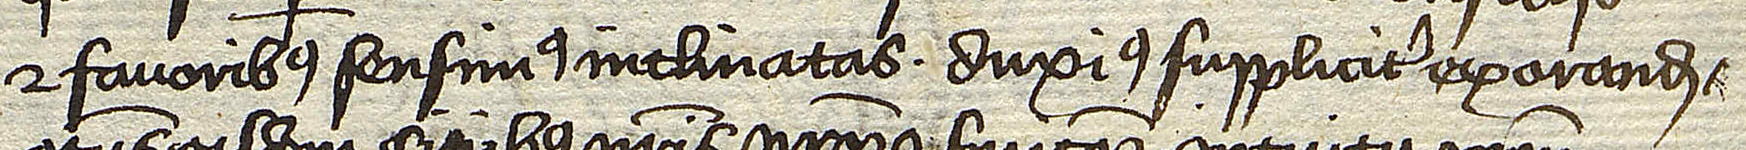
@ fauorib* ſenſim* inclinatas . duxi* ſupplicit* exorand* /
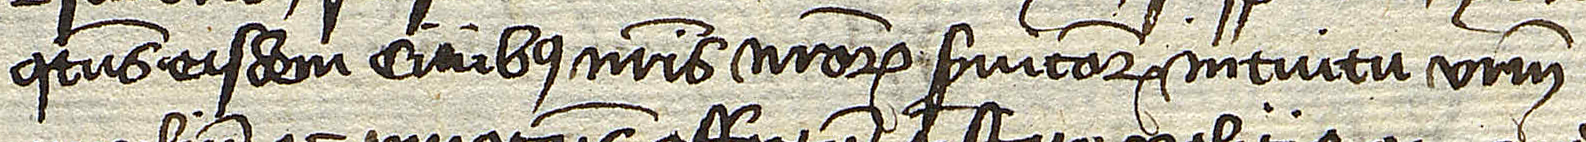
q*t*us eiſdem Ciuib* n*ris n*ro* ſ*uic*o* intuitu v*r*m
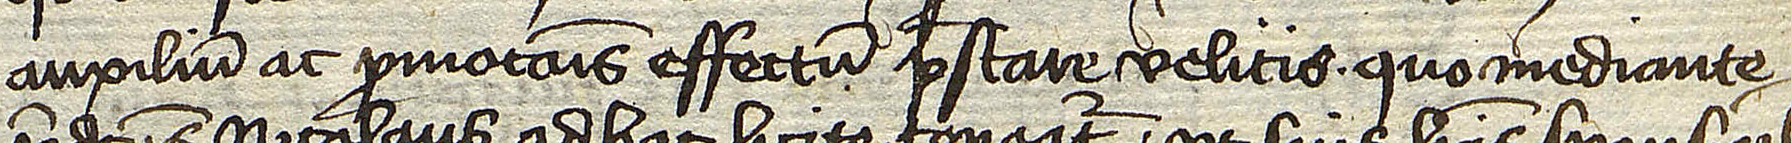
auxiliu* ac p*moc*o*is effectu* p*ſtare velitis . quo mediante
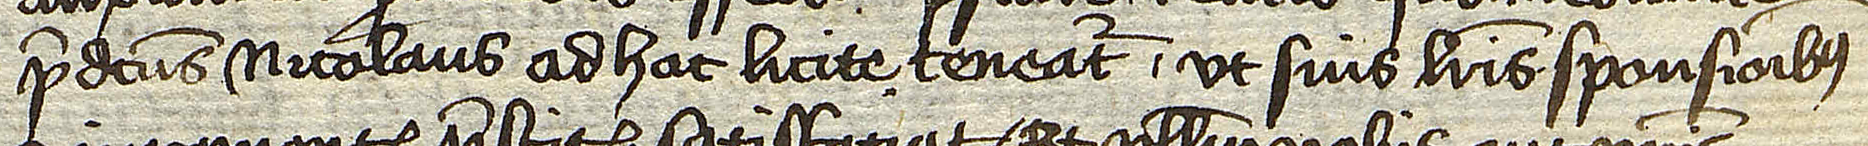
p*d*c*us Nicolaus ad hoc licite teneat* / vt ſuis l*ris ſponſio*ib*
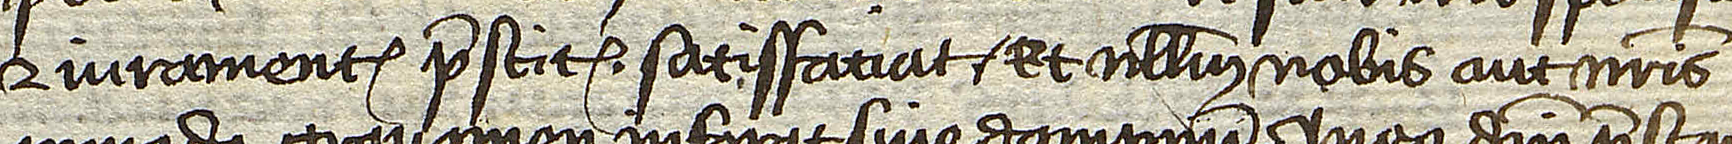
@ iurament* p*ſtit* ſatiſfacit / Et n*ll*m nobis aut n*ris
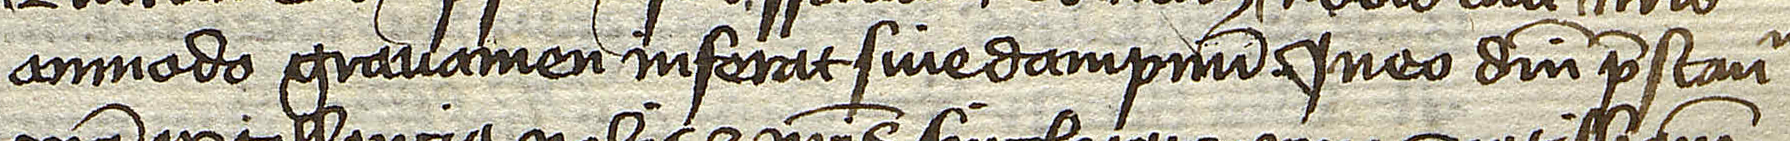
ammodo grauamen inferat ſiue dampnu* . In eo d*ni p*ſtan*
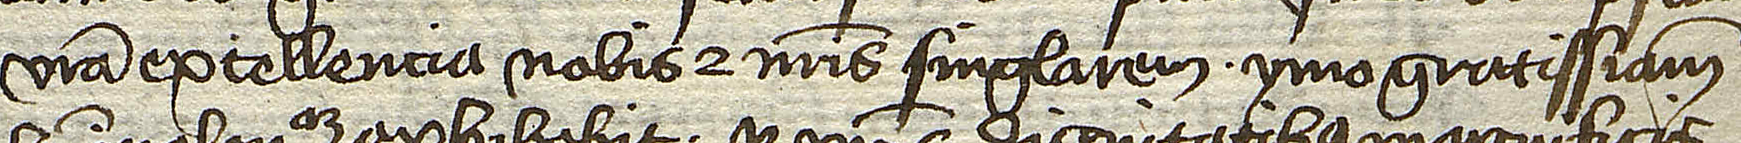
v*ra excellencia nobis @ n*ris ſingularem . ymo gratiſſi*am
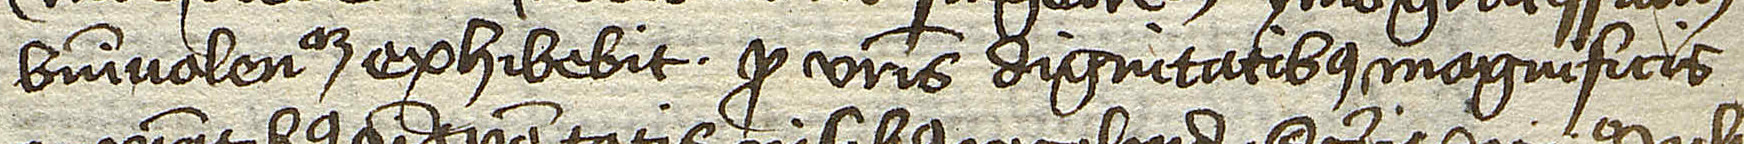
b*niuolen* exhibebit . p* v*ris dignitatib* magnificis
